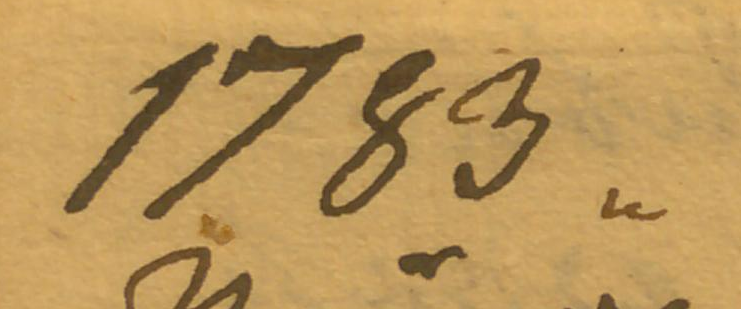1783
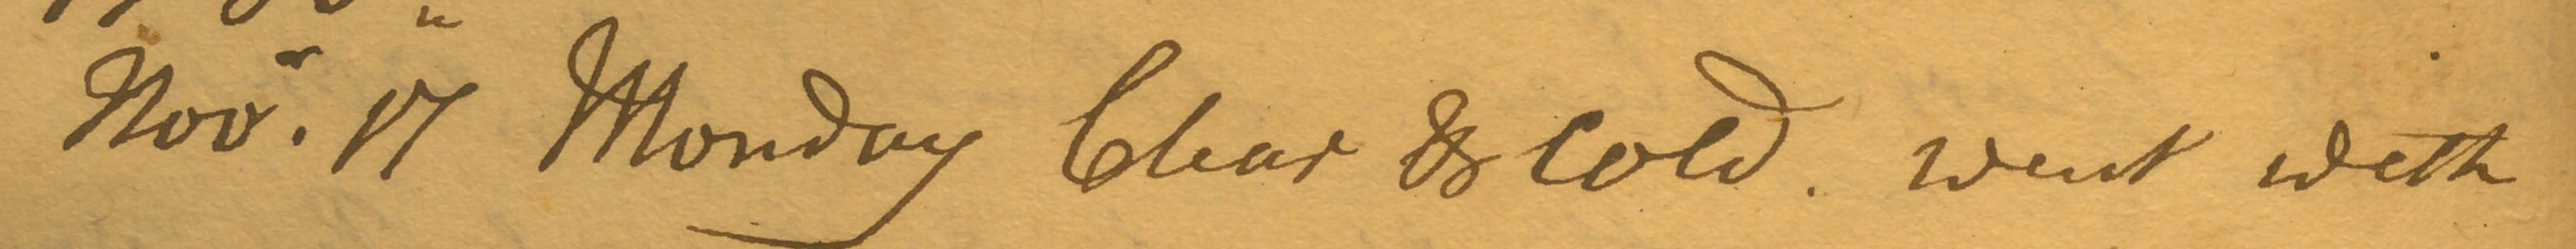Nov^r. 17 Monday Clear & Cold, went with
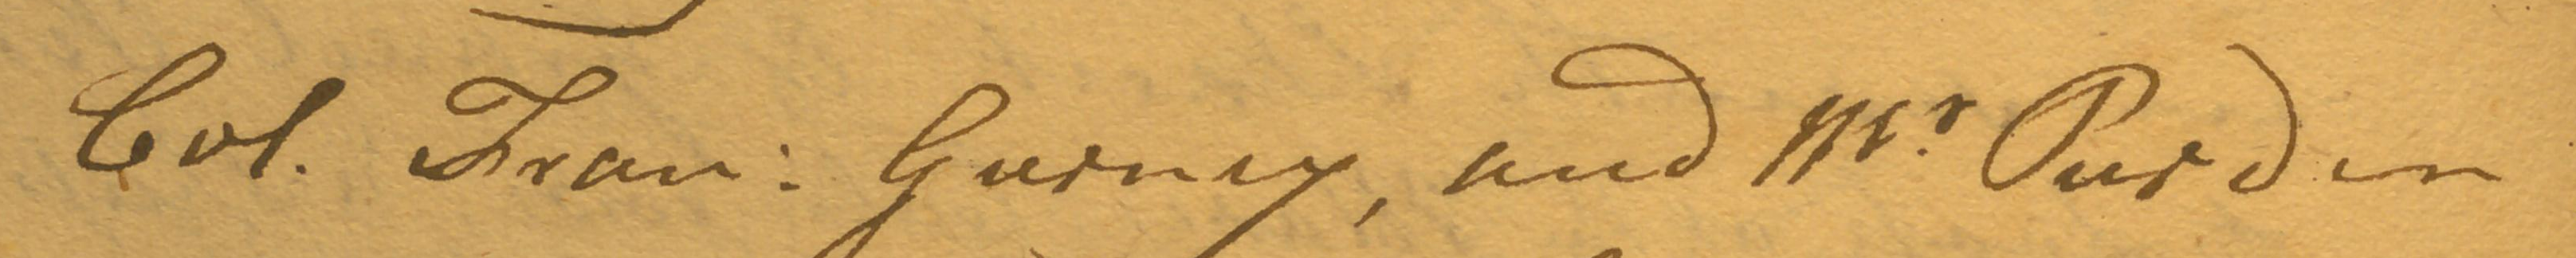Col. Fran: Gurney and M^r. Purdue
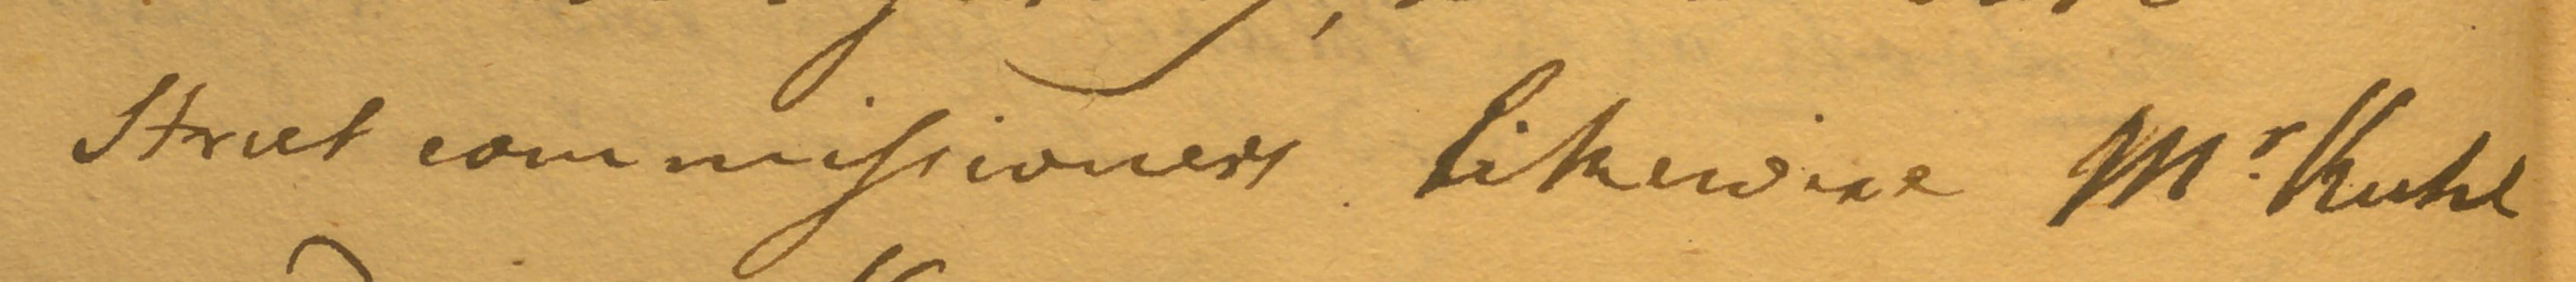Street commissioners likewice M^r. Kuhl
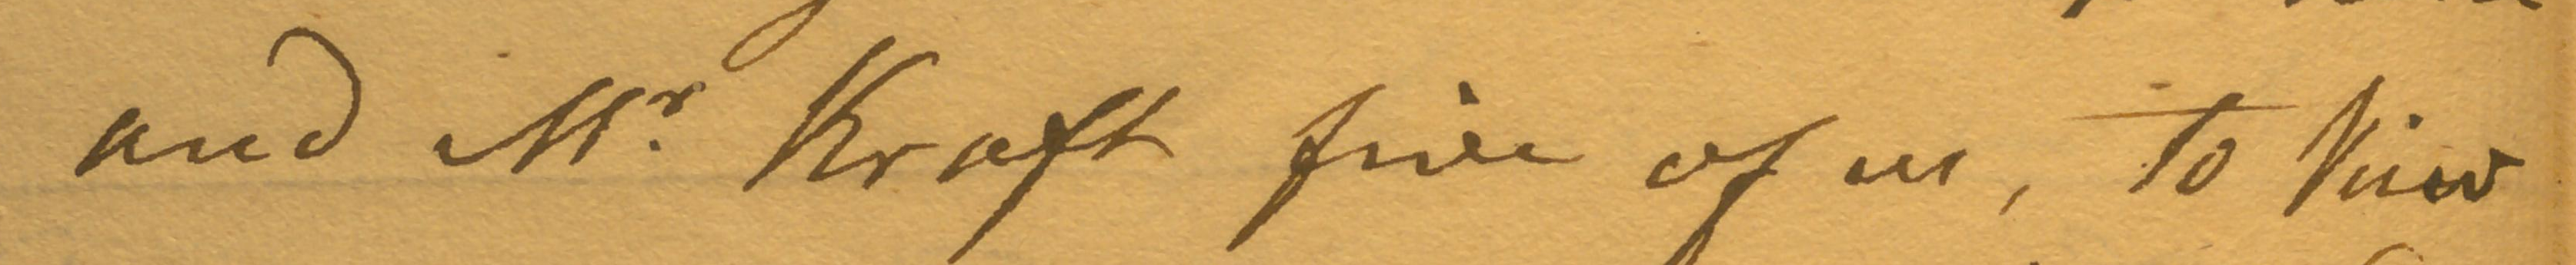and M^r. Kraft five of us, to View
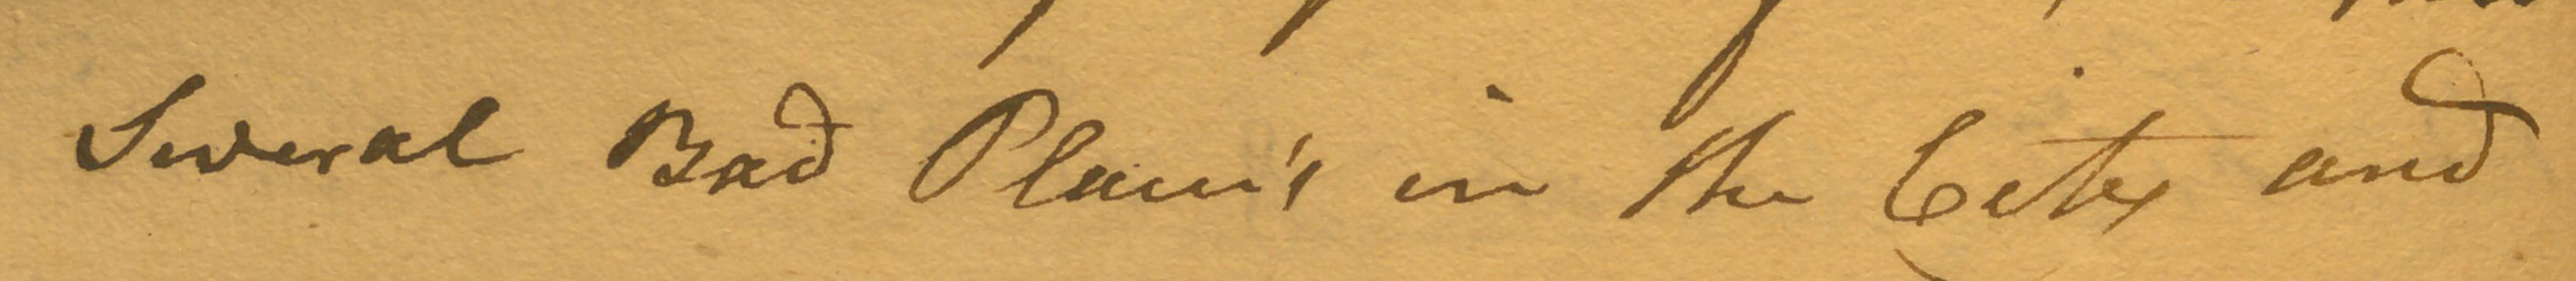Several Bad Place's in the City and
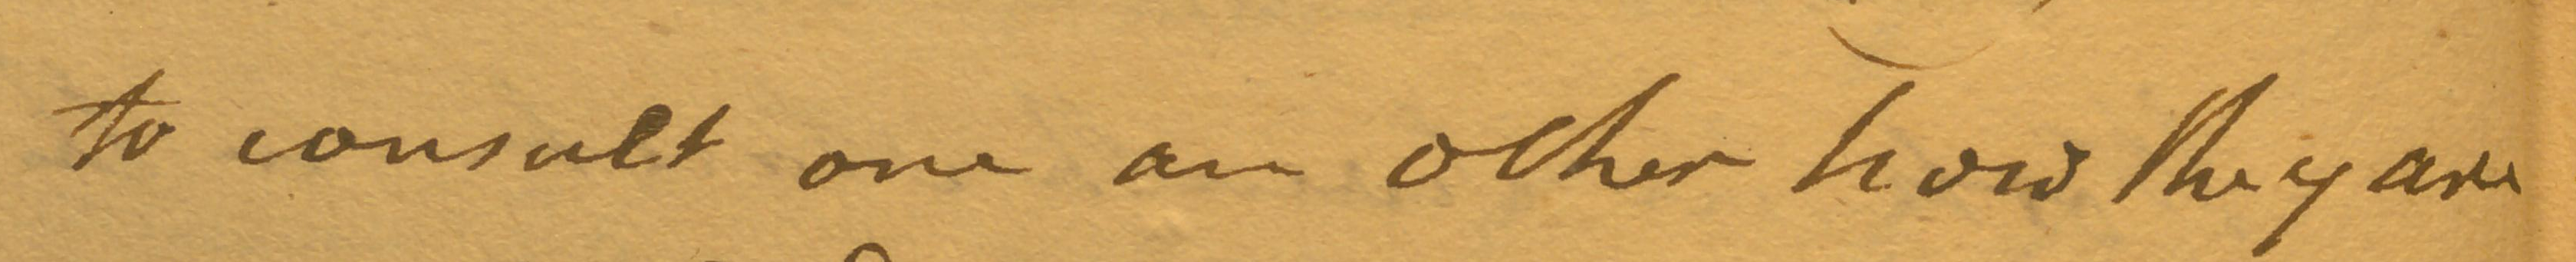to consult one an other how they are
